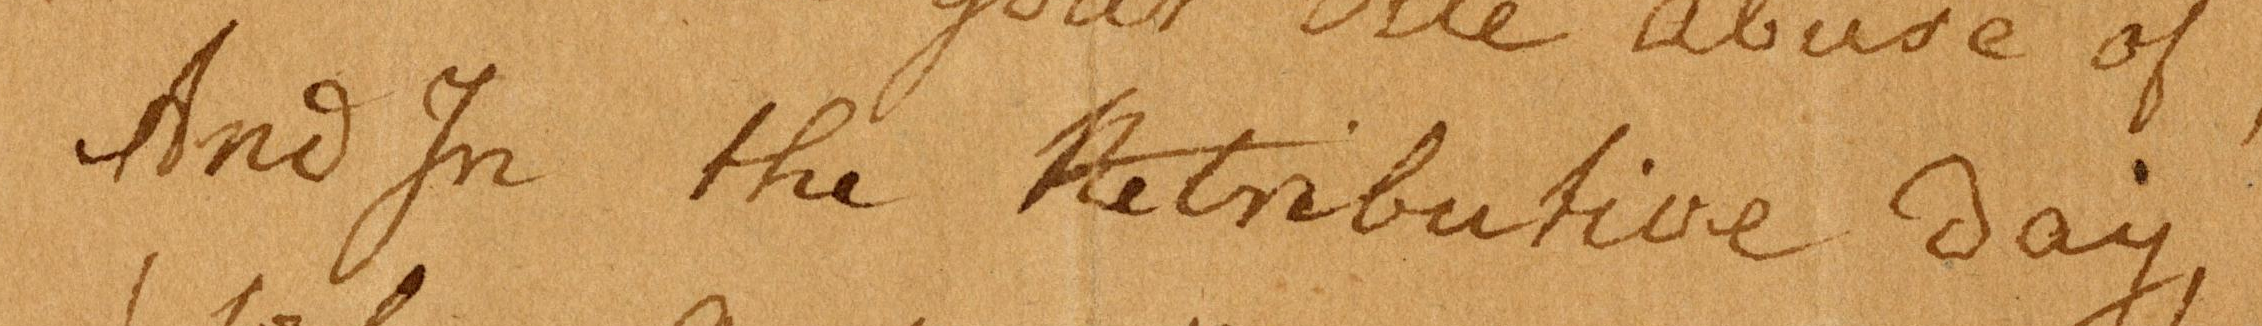And In the Retributive day;
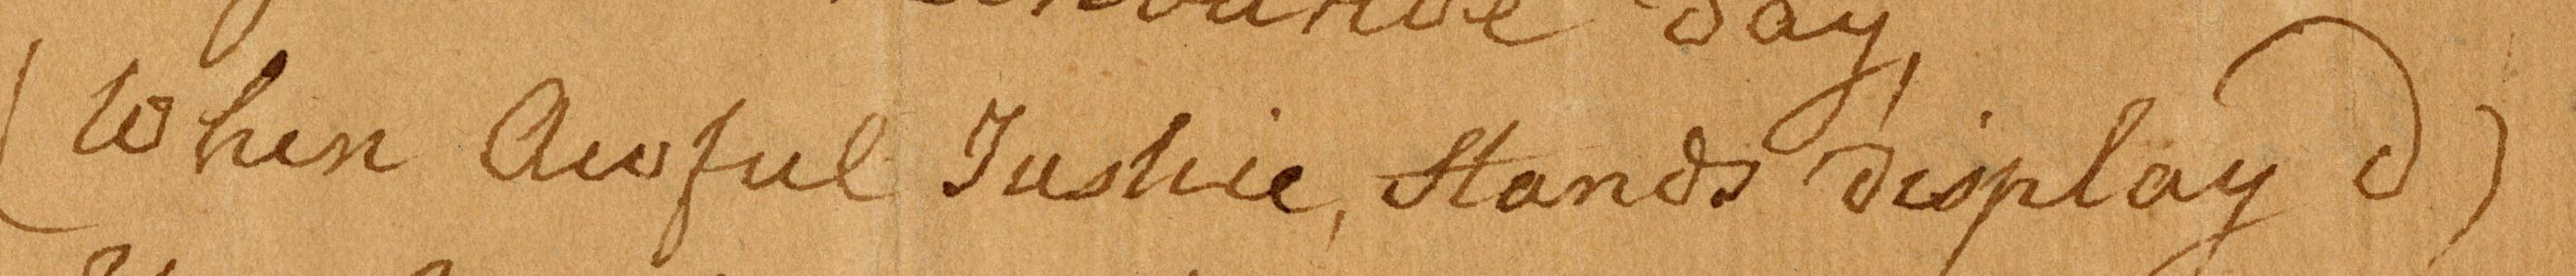(When Awful Justice, Stands displayd)
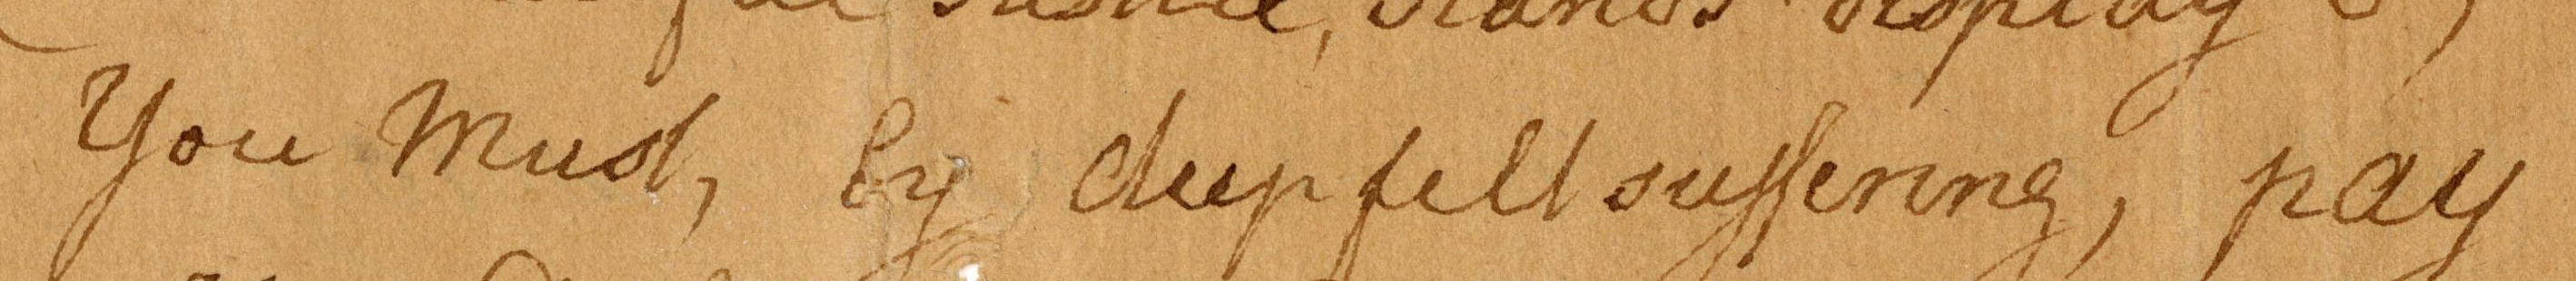You Must, by deepfelt suffering, pay
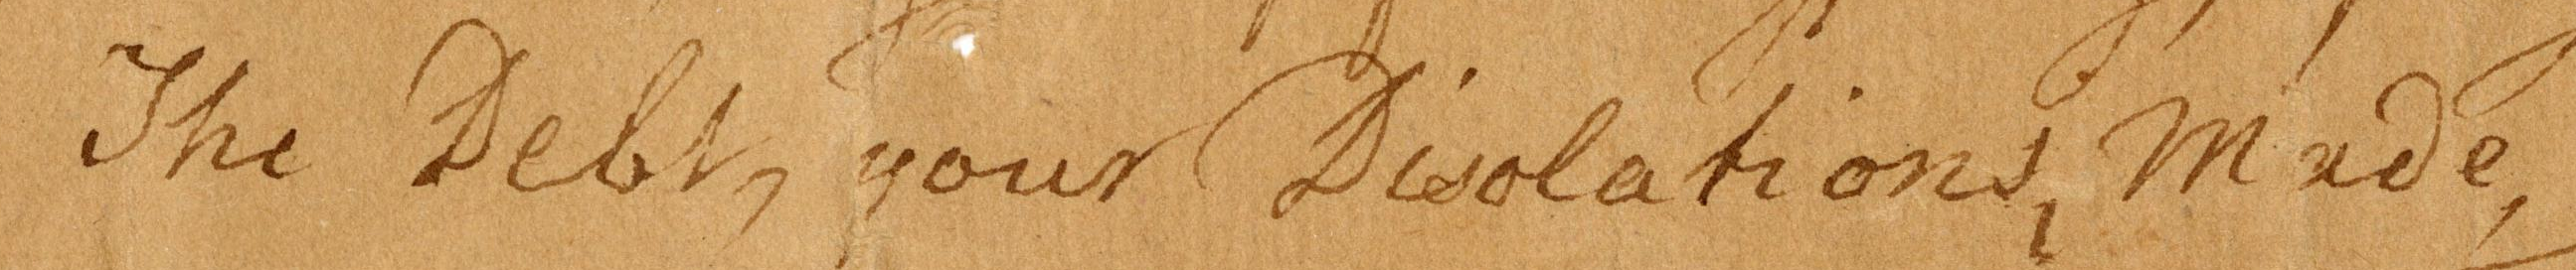The Debt, your Disolations, Made,
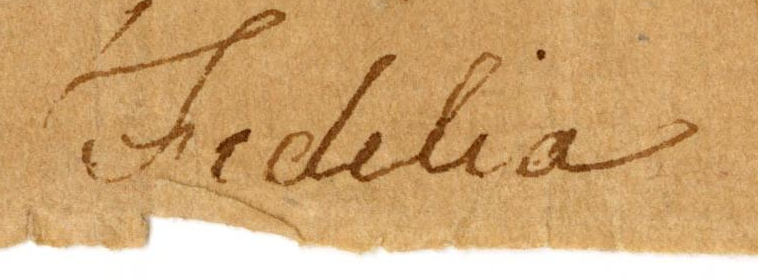Fidelia
